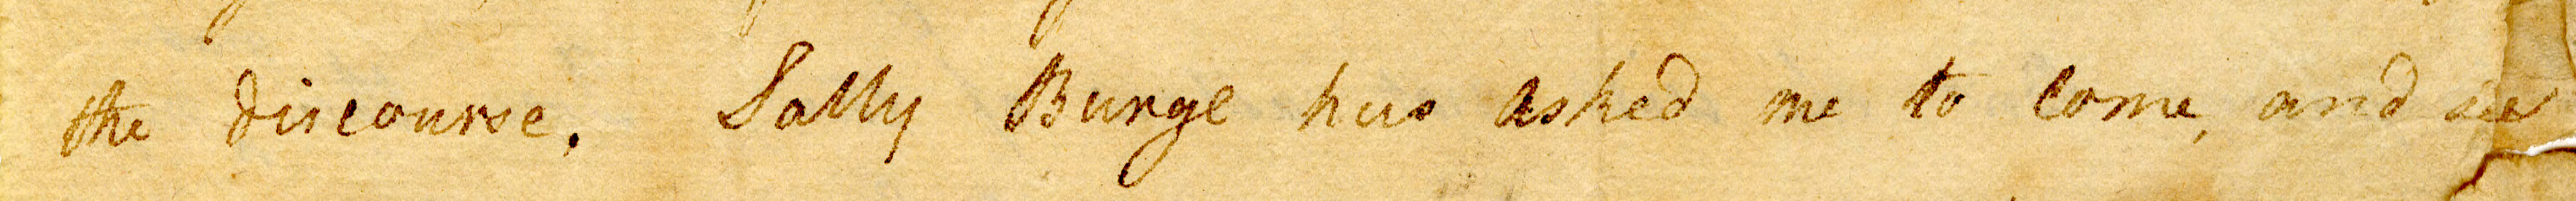the discourse. Sally Bunge has asked me to come and s
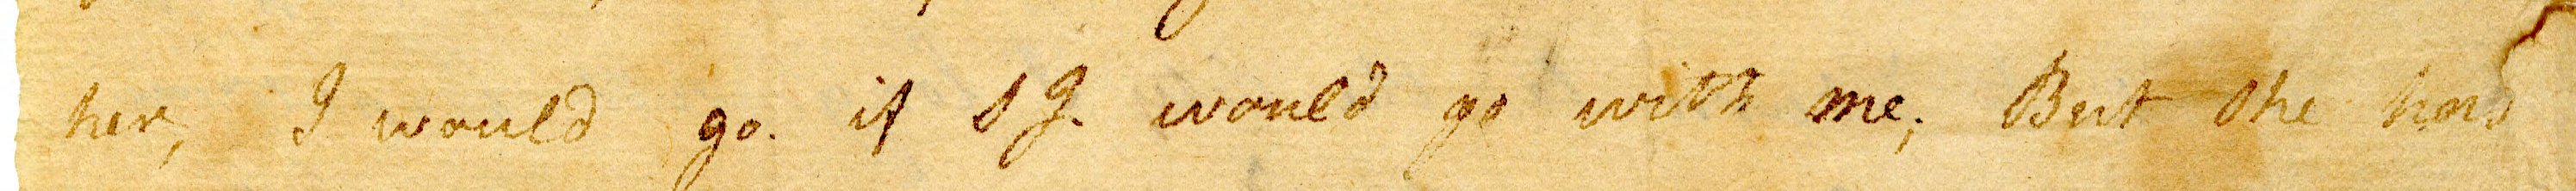her, I would go if SJ. would go with me. But she has
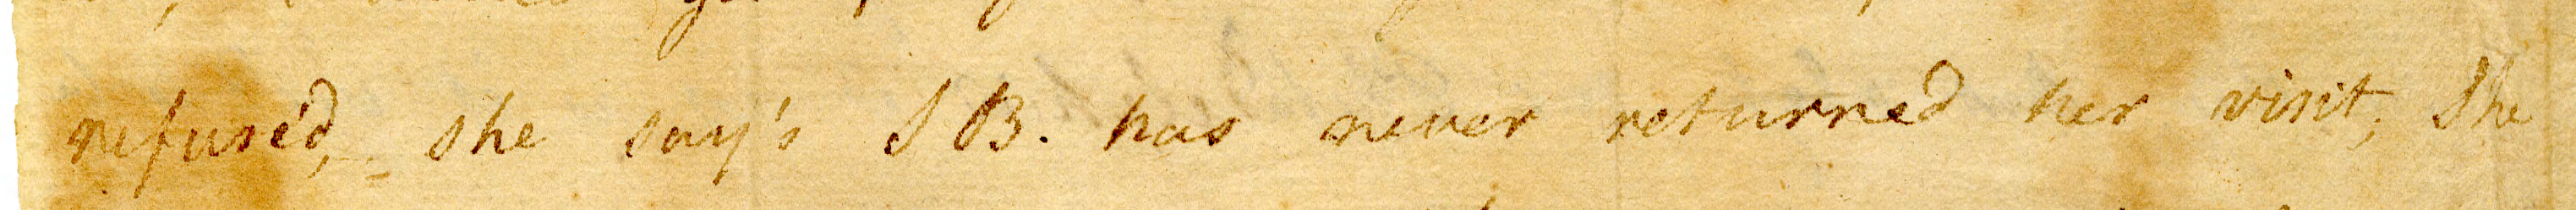refused she say's SB. has never returned her visit, She
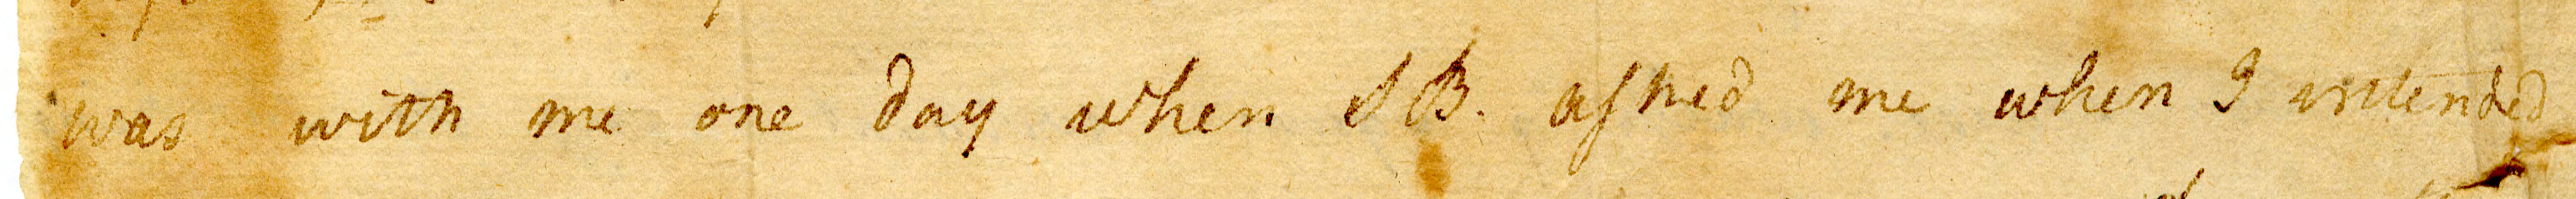was with me one day when SB. asked me when I intended
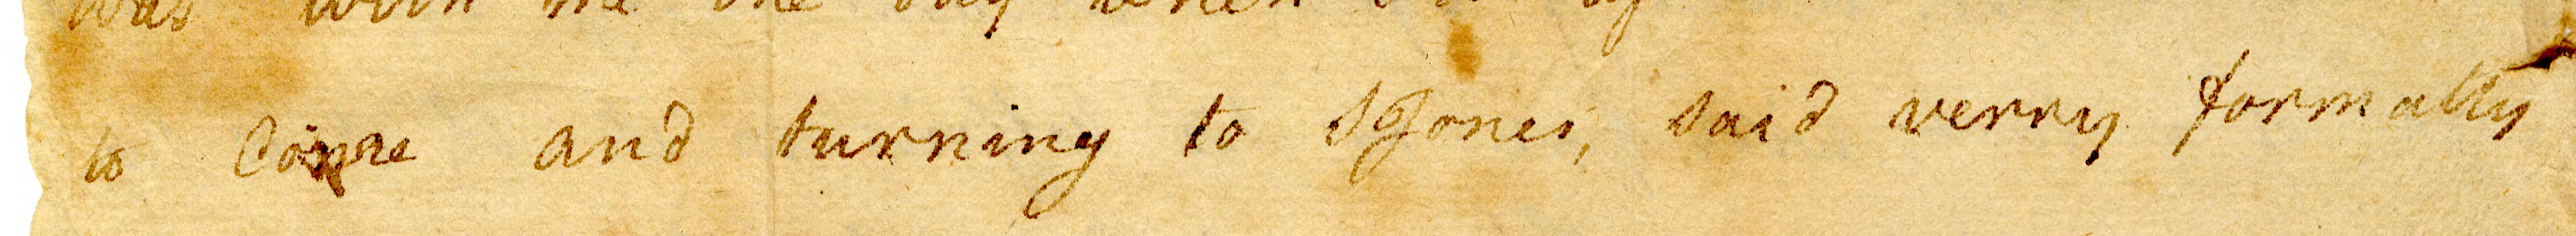to come and turning to S Jones, said verry formally
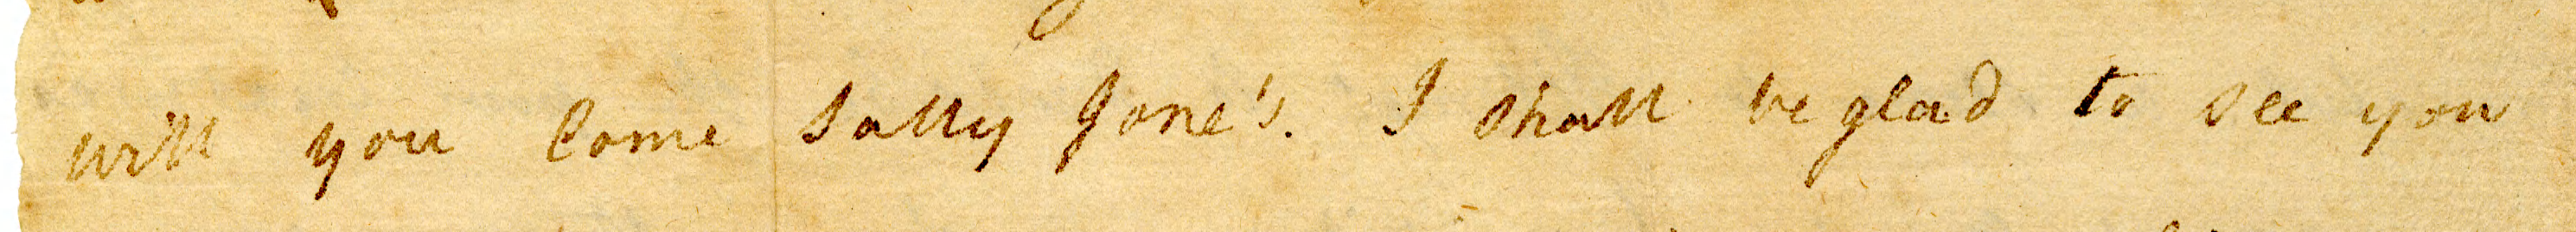will you come Sally Jone's. I shall be glad to see you
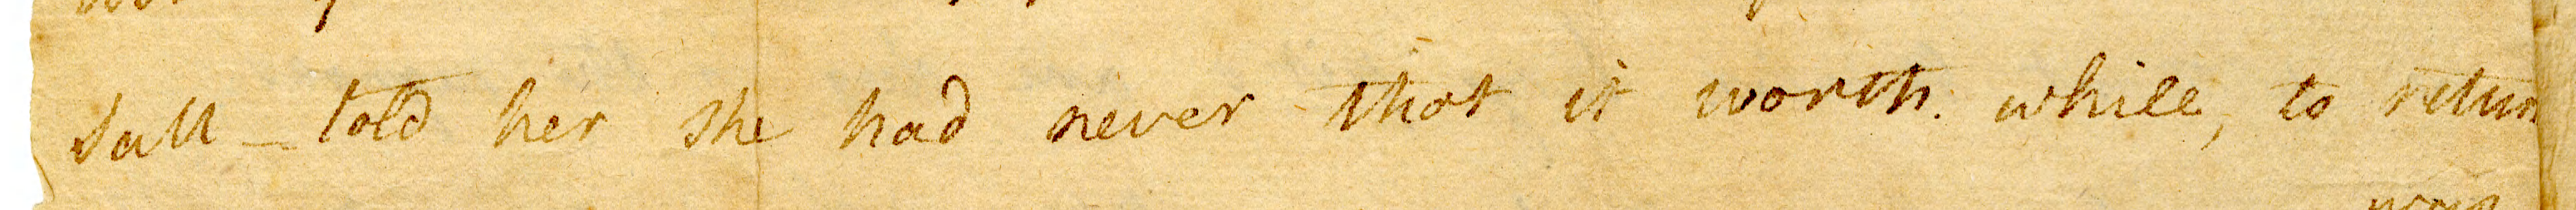Sall- told her she had never thot it worth while, to retur
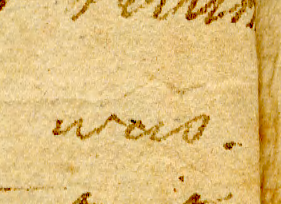was
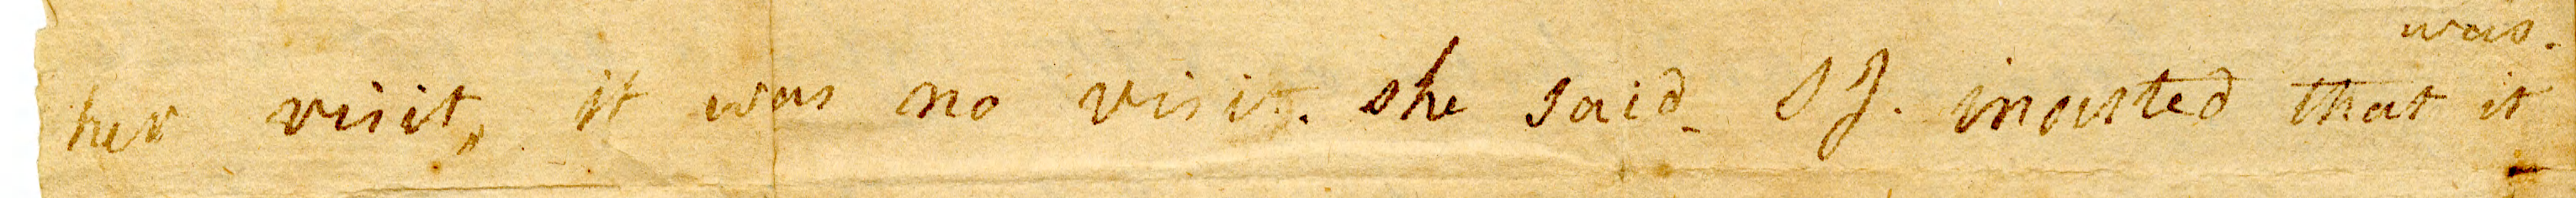her visit, it was no visit she said SJ insisted that it
